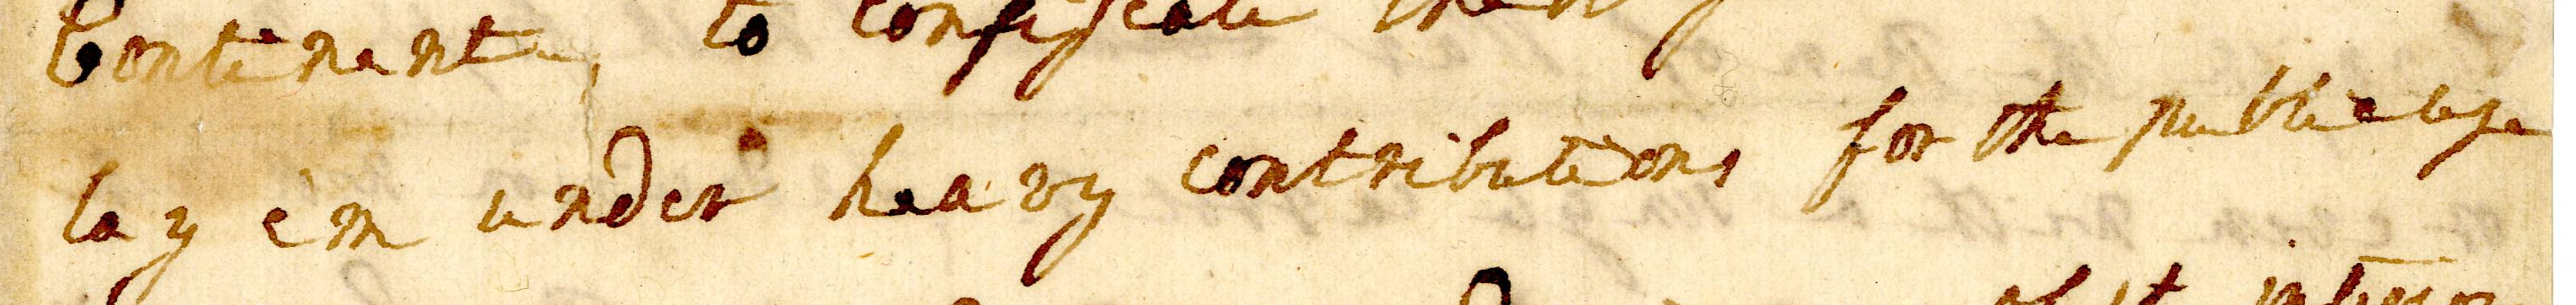lay em under heavy contributions for the public by
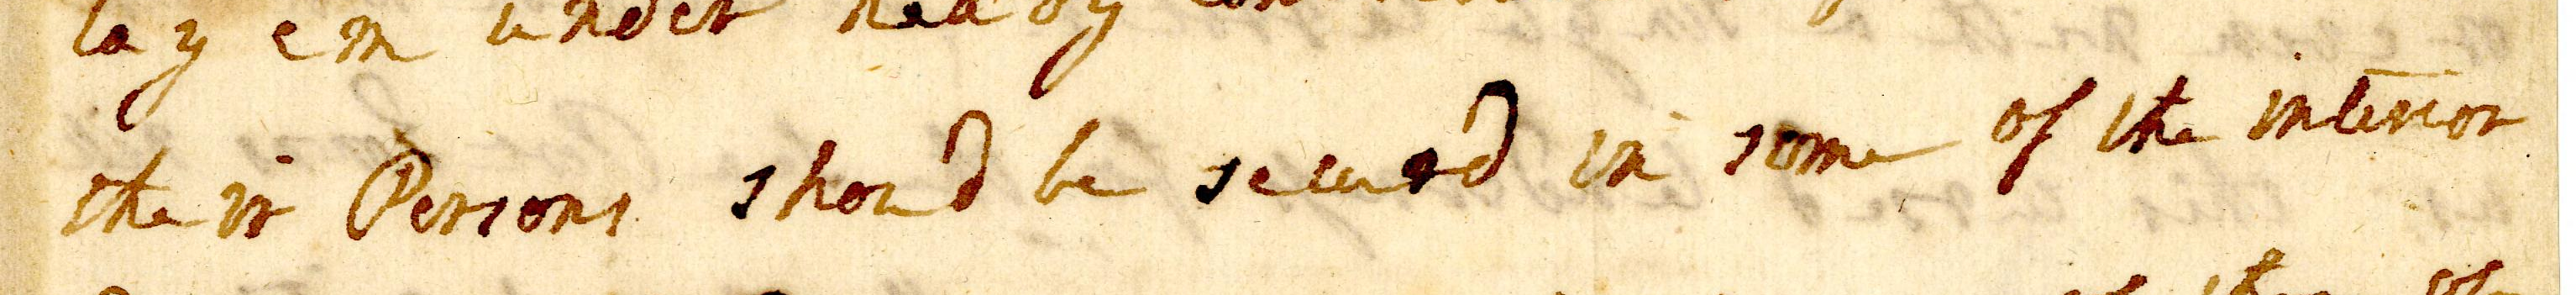their Persons shou'd be securd in some of the interior
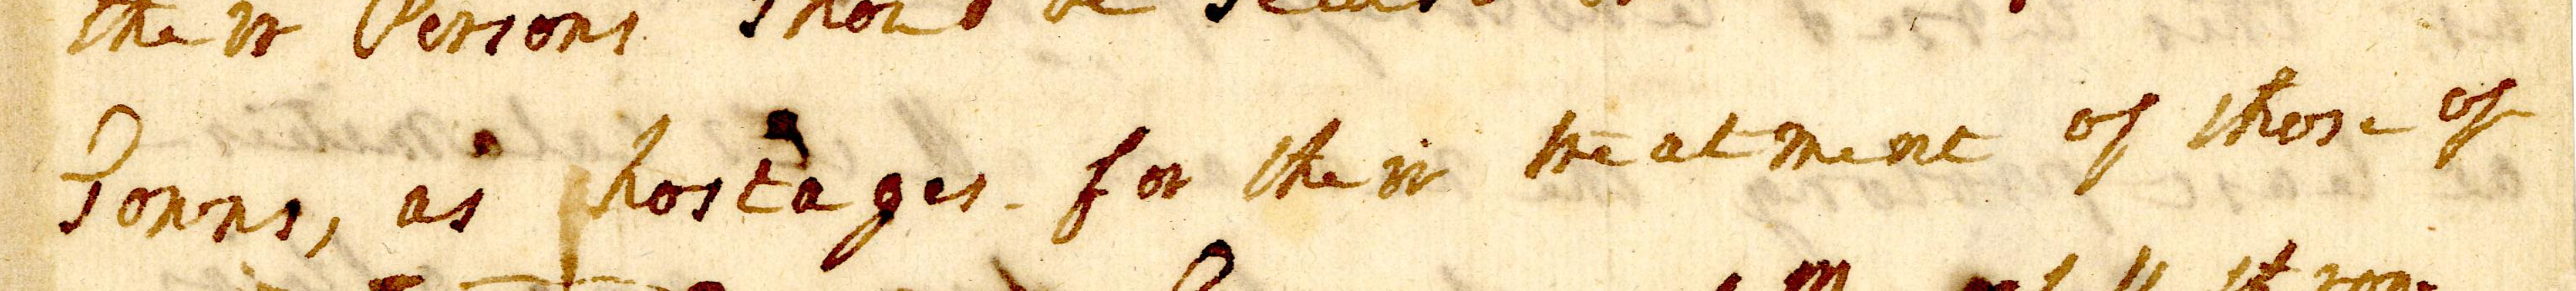Towns, as hostages for their treatment of those of
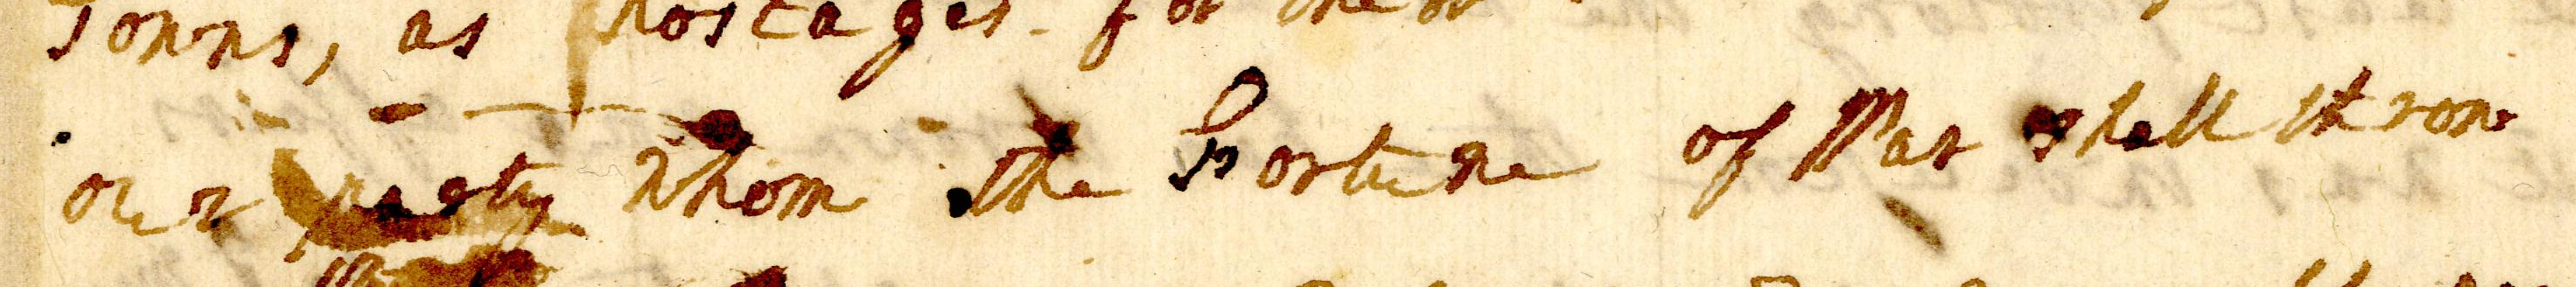or party whom the Fortune of War shall throw
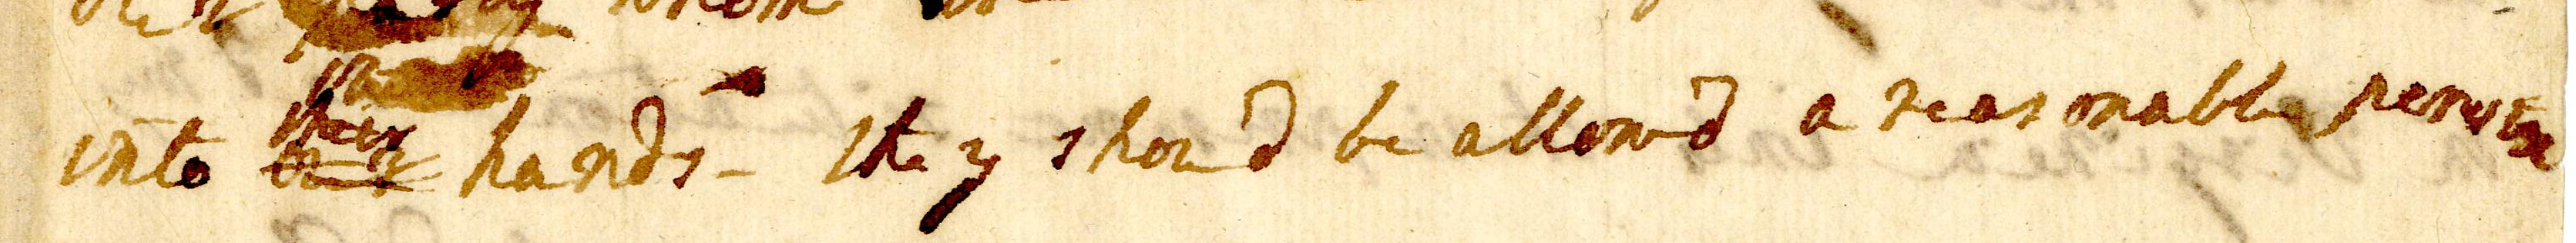into their hands- they shoud be allowd a reasonable person-
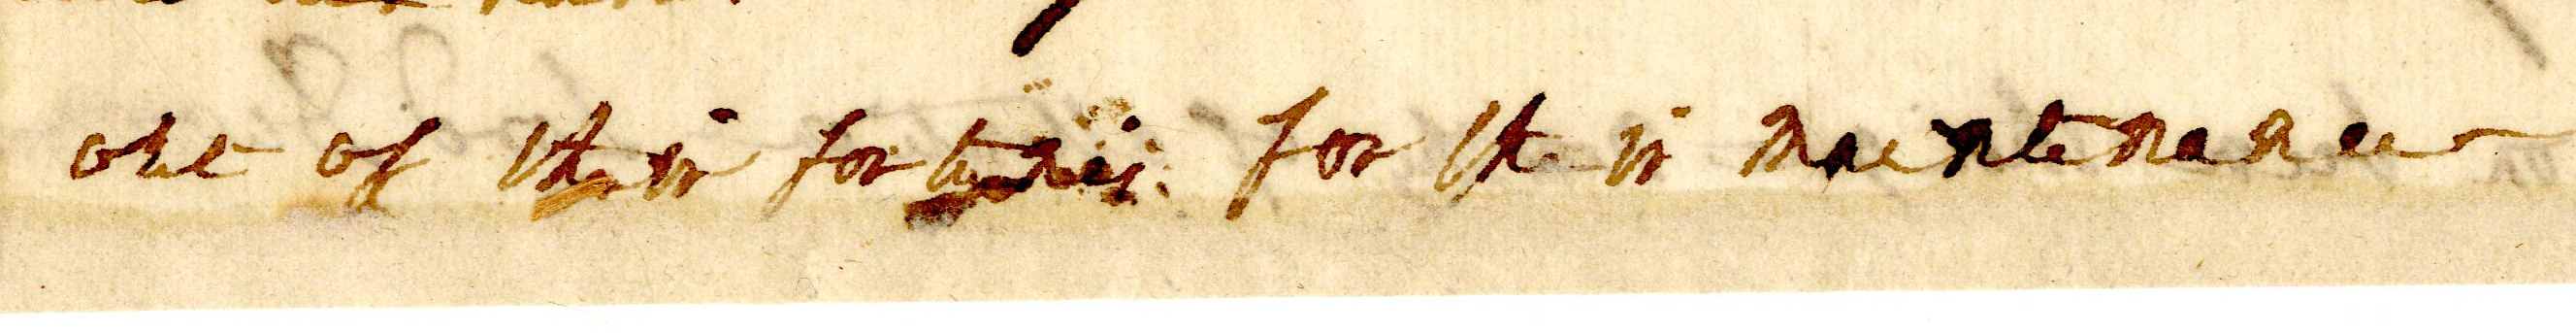-able of their fortunes for their remittance
